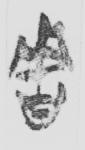周
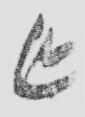亡
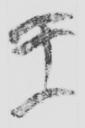王
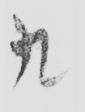九
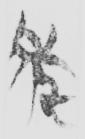年
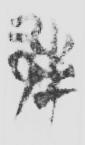邦
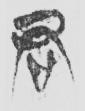君
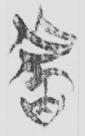者
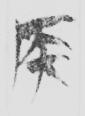侯
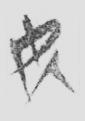𡚦
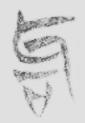{㠯ㅋ}
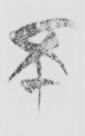不
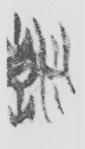朝
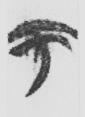于
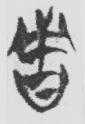周
